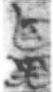聶（攝）
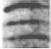三
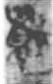○（豻）
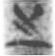之
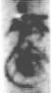○（箙）
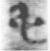屯
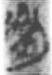○（絶）
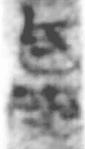聶（攝）
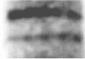二
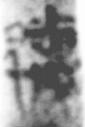○（秦）
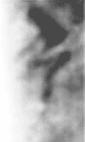弓
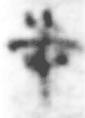矢
